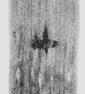十
